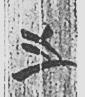之
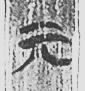亓
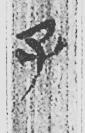子
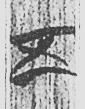五
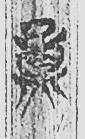員
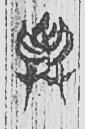與
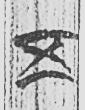五
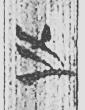之
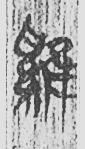雞
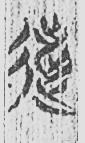逃
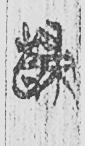{𡴎帚}
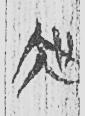吳
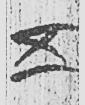五
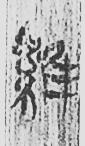雞
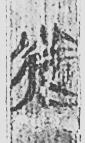{辶羊}
